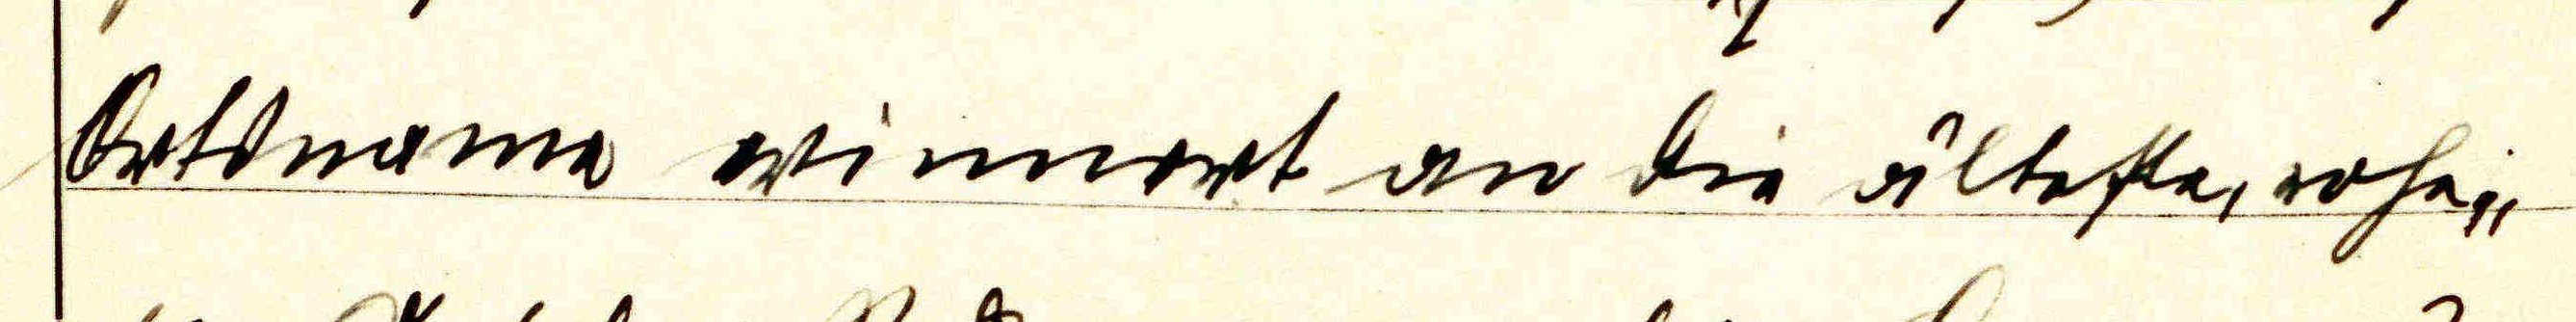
Ortsnameerinnert an die älteste rohe-
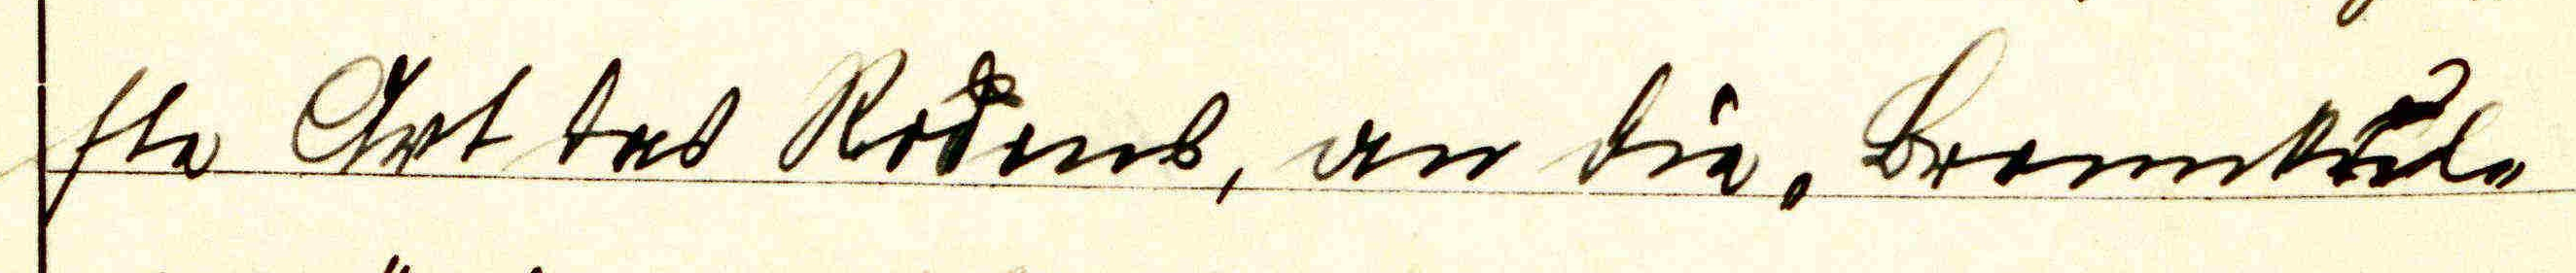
ste Art des Rodens, an die "Branndkul-
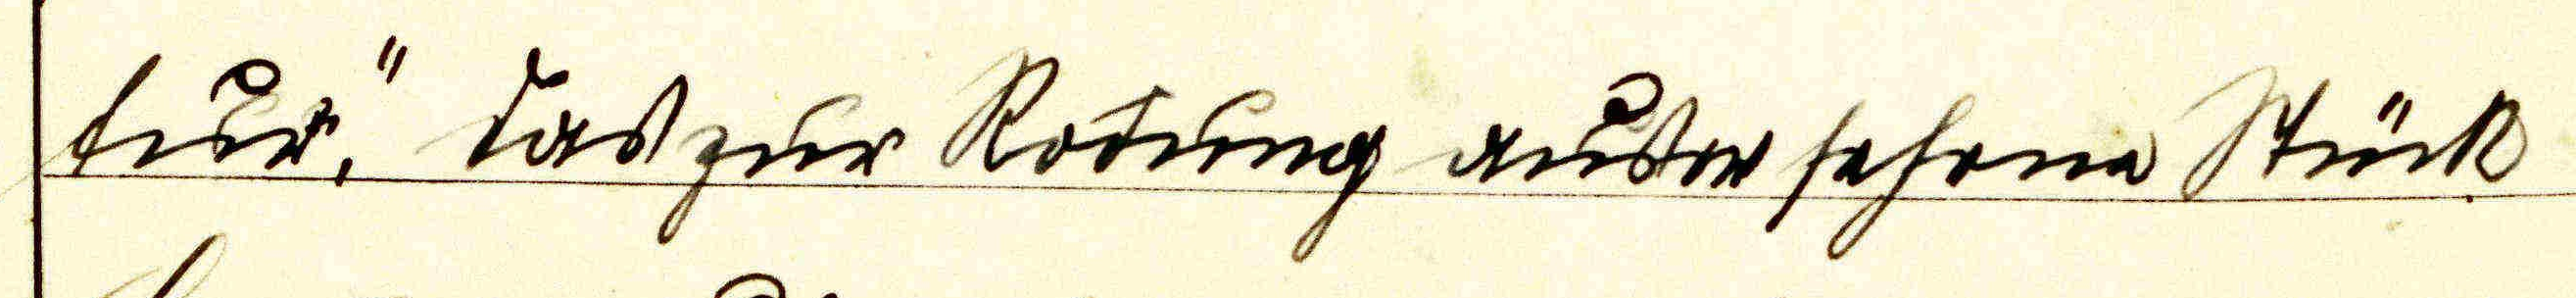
tur", das zur Rodung außersehene Stück
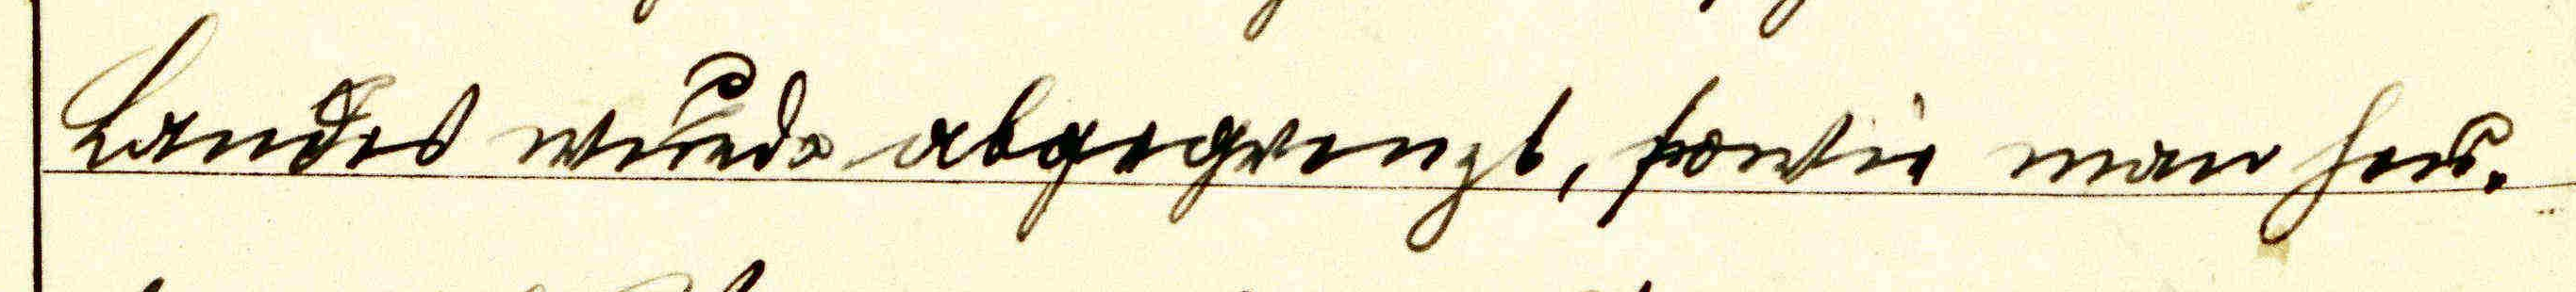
Landes wurde abgegrenzt, sowie man heu-
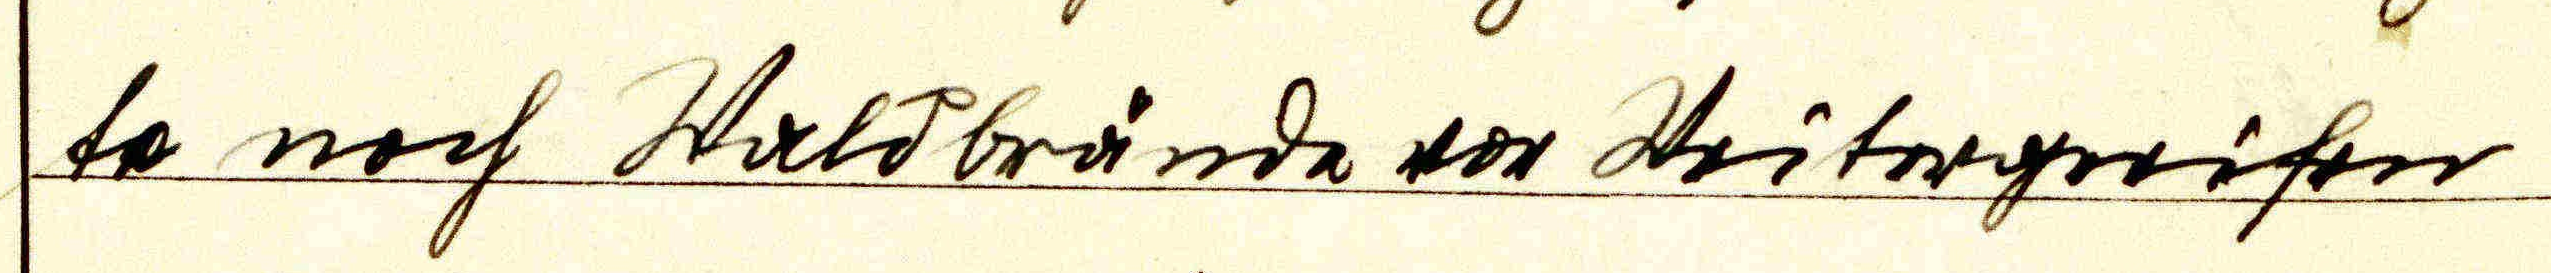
te noch Waldbrände vor Weitergreifen
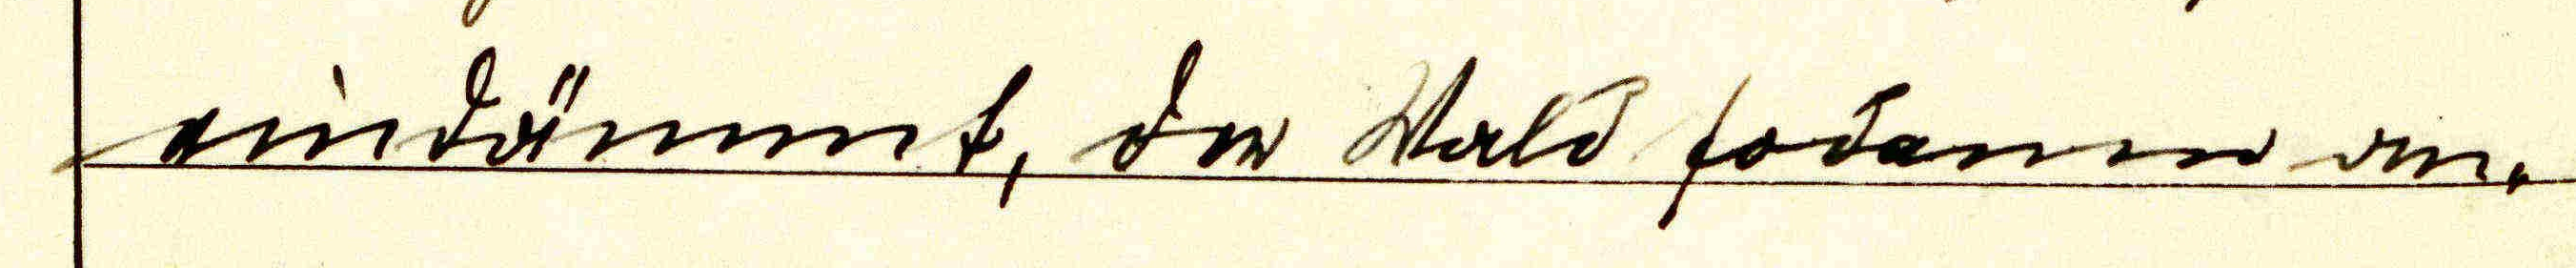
eindämmt, der Wald sodann an-
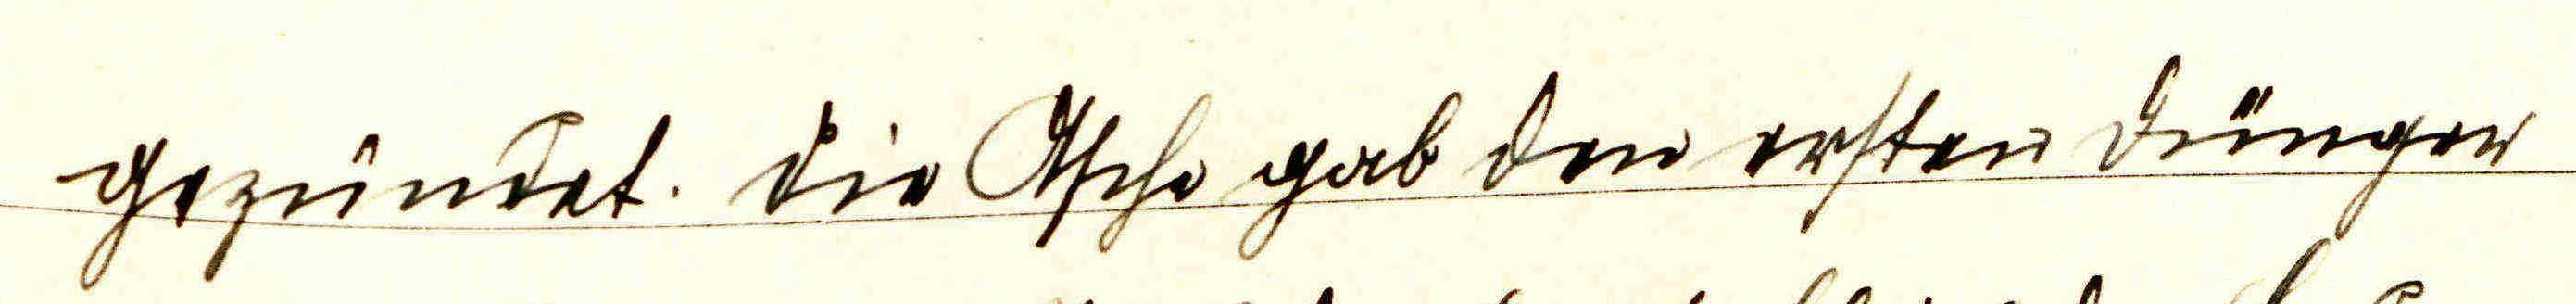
gezündet. Die Asche gab den ersten Dünger
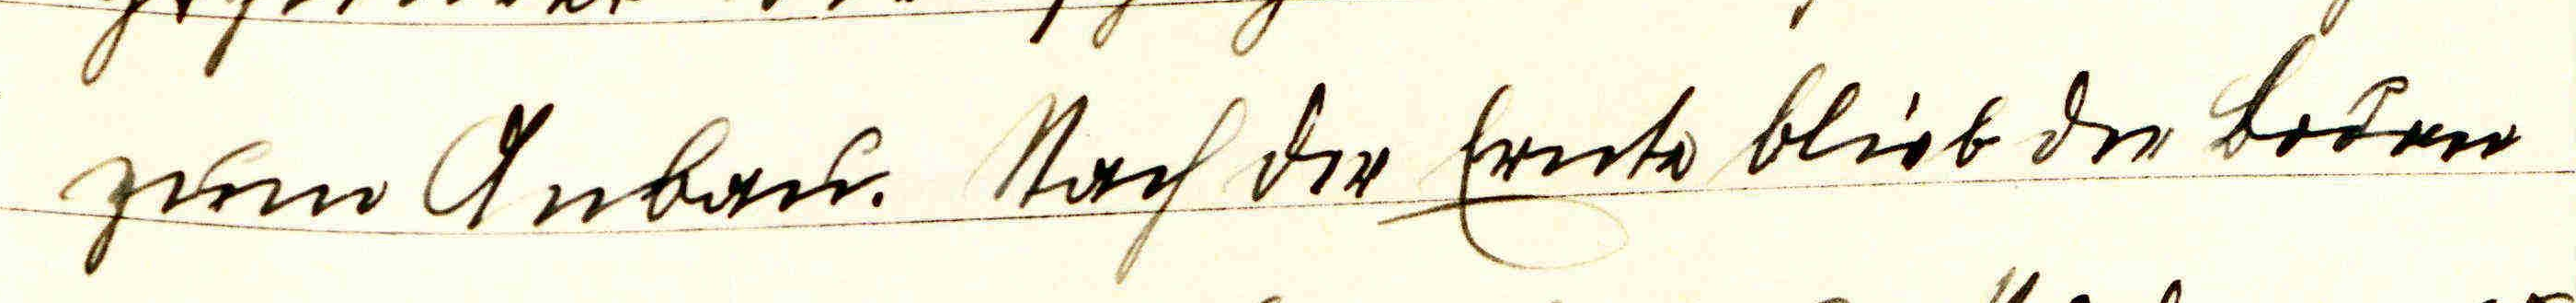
zum Anbau. Nach der Ernte blieb der Boden
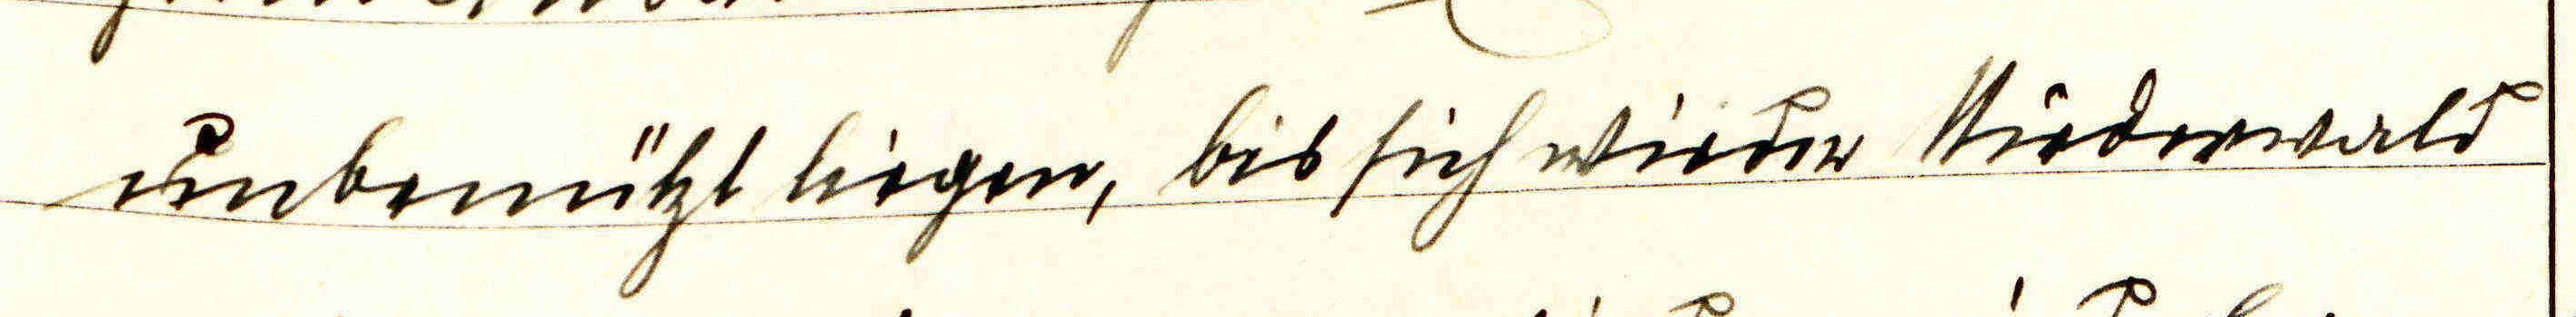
unbenützt liegen, bis sich wieder Niederwald
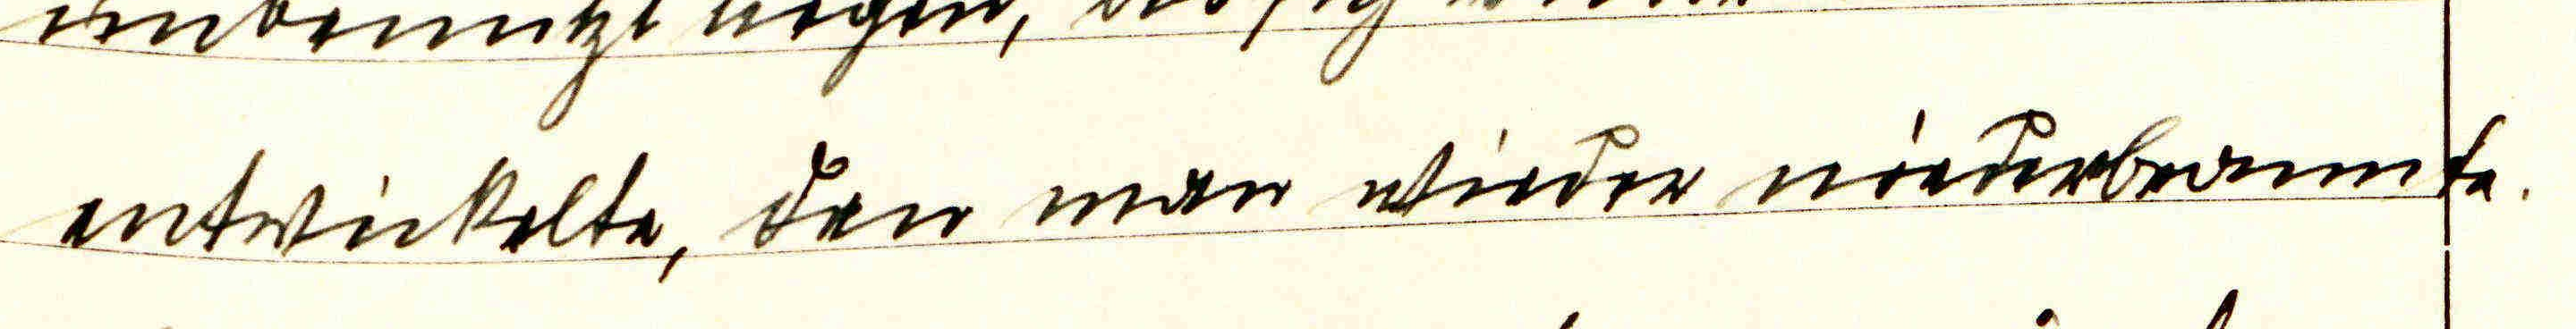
entwickelte, den man wieder niederbrannte.
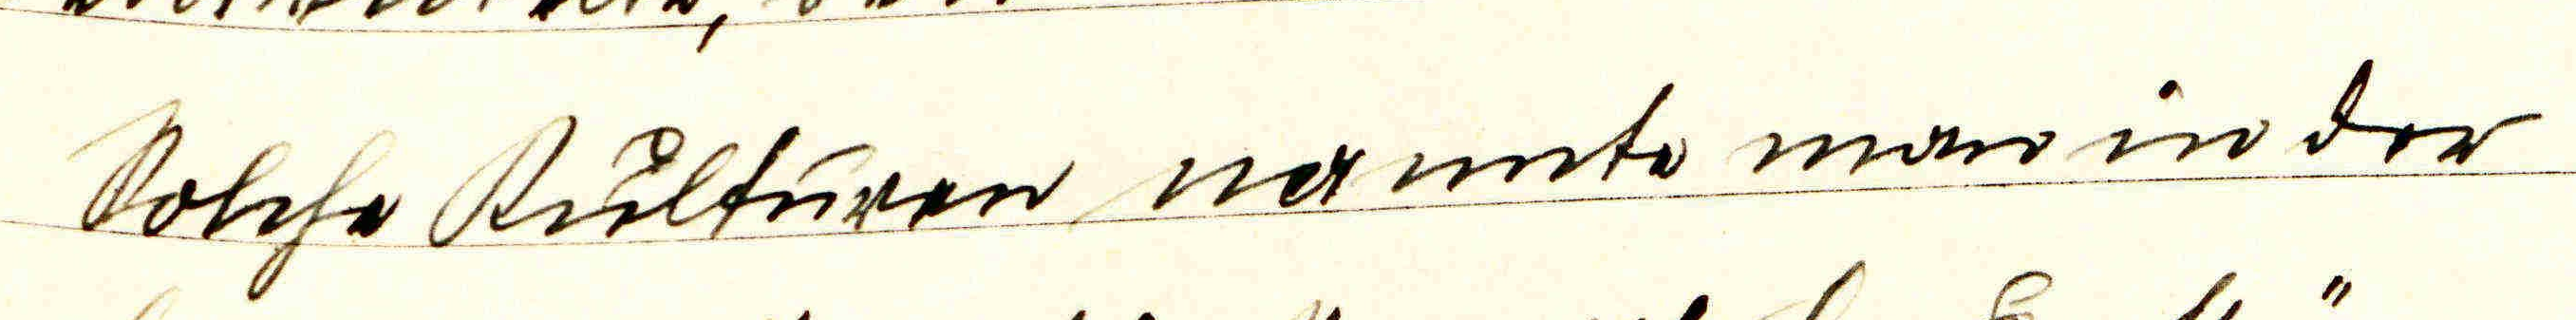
Solche Kulturen nannte man in der
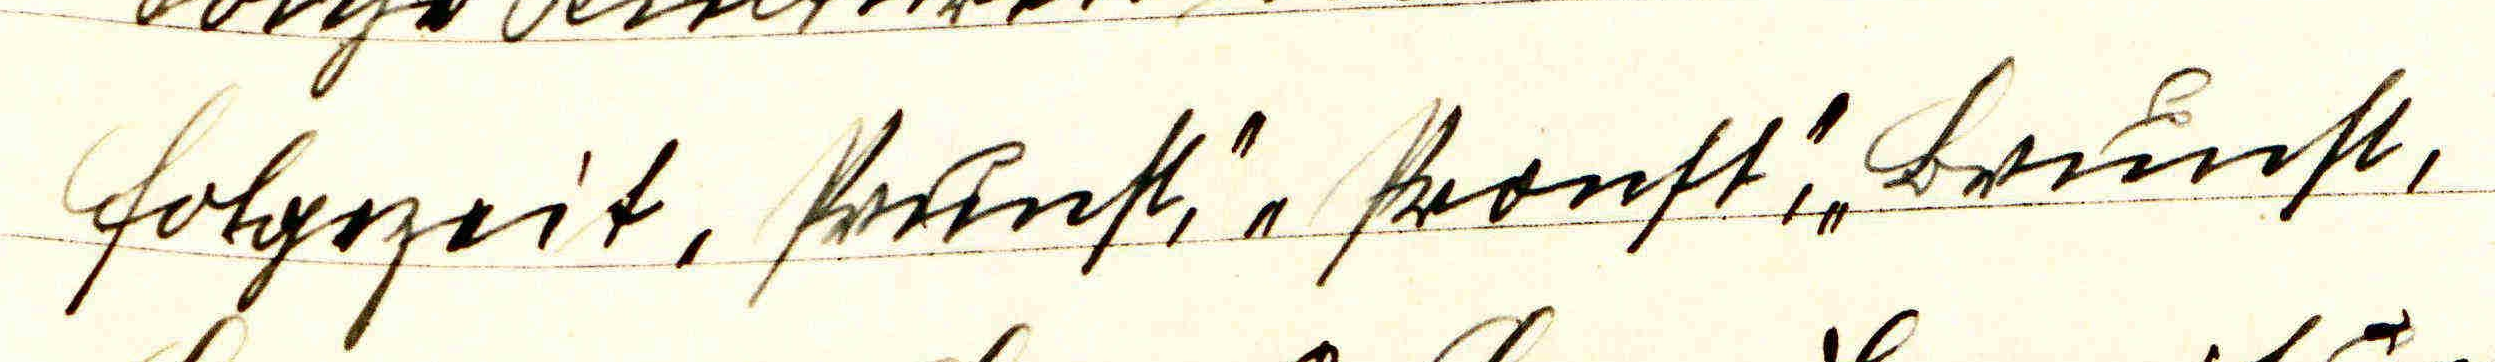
Folgezeit "Prunst", "Pronst", "Brunst",
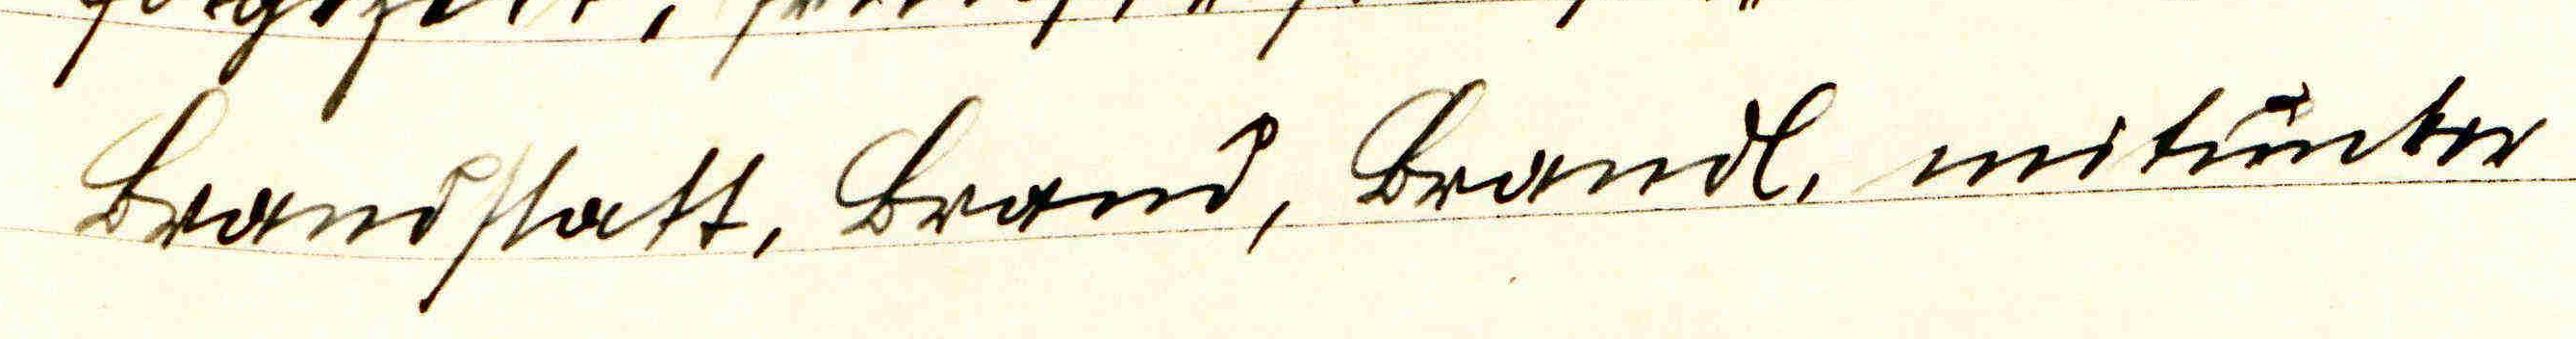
Brandstatt, Brand, Brandl, mitunter
